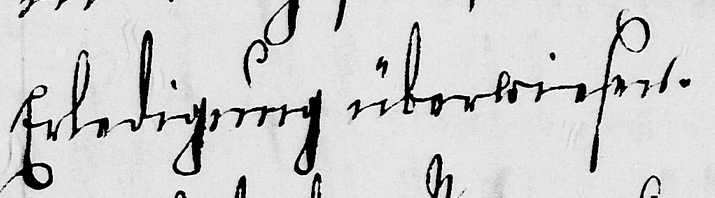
Erledigung überwiesen.
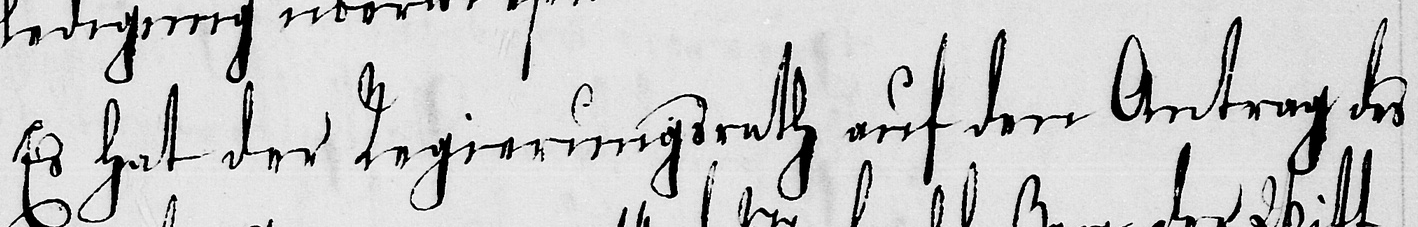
Es hat der Regierungsrath auf den Antrag des
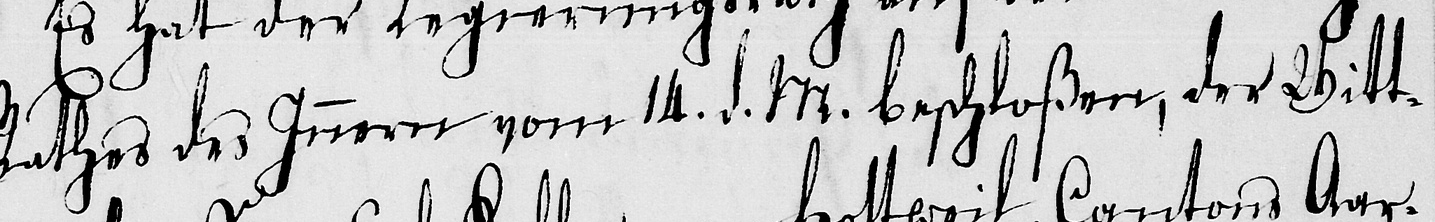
Rathes des Innern vom 14. d. M. beschloßen, der Witt¬
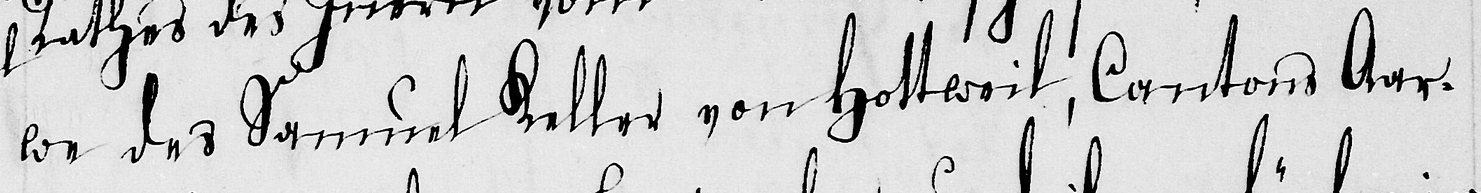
we des Samuel Keller von Hottweil, Cantons Aar¬
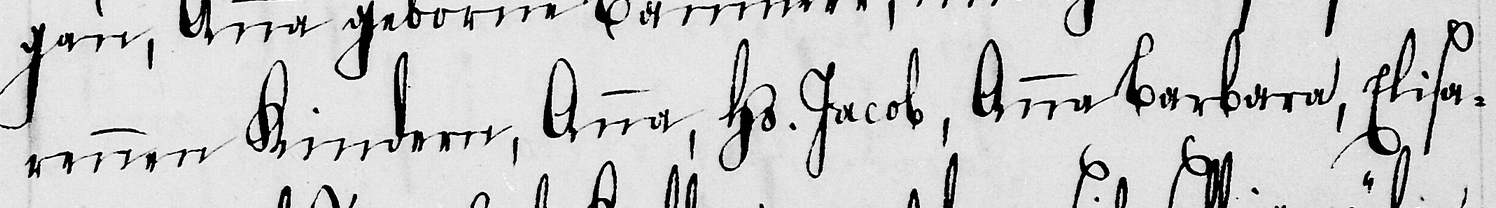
rennen Kindern, Anna, Hs. Jacob, Anna Barbara, Elisa¬
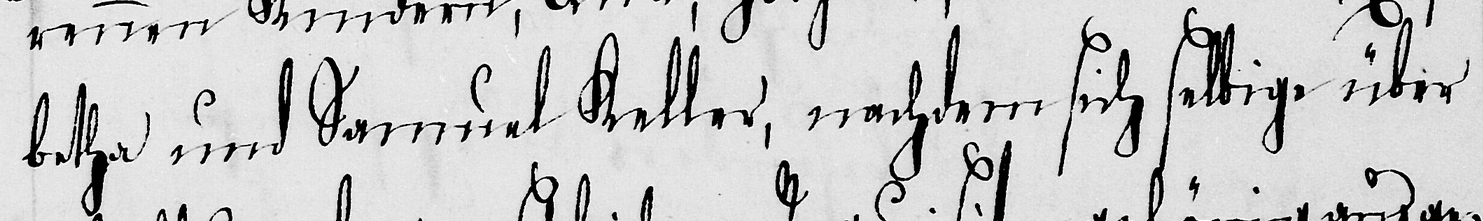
betha und Samuel Keller, nachdem sich selbige über
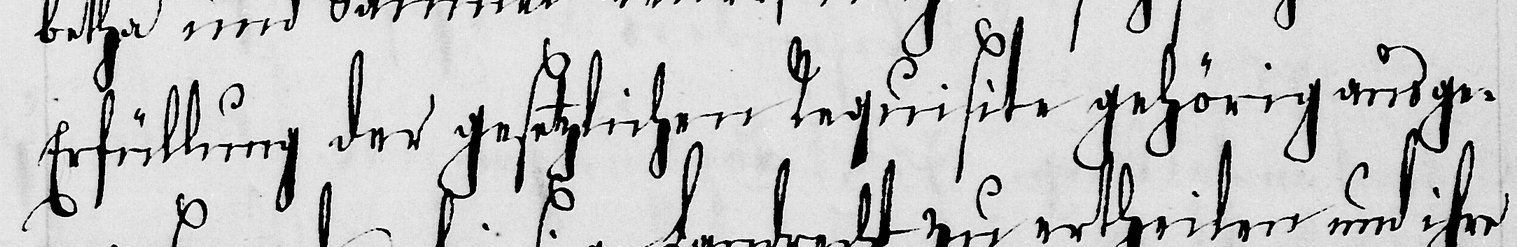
Erfüllung der gesetzlichen Requisite gehörig ausge¬
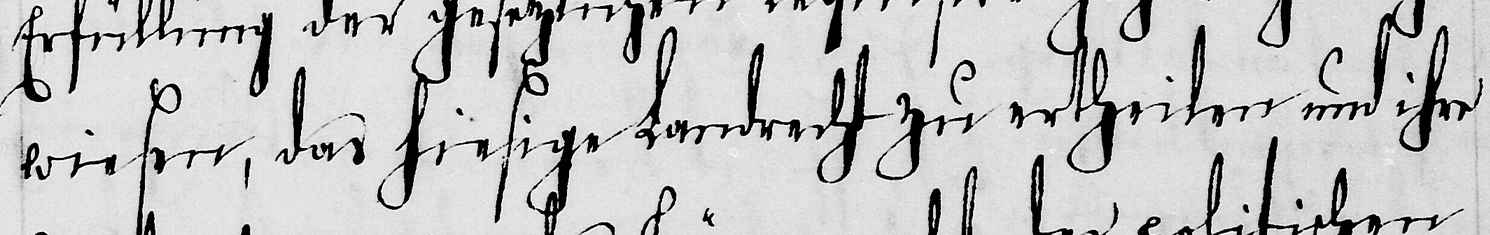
wiesen, das hiesige Landrecht zu ertheilen und ihre
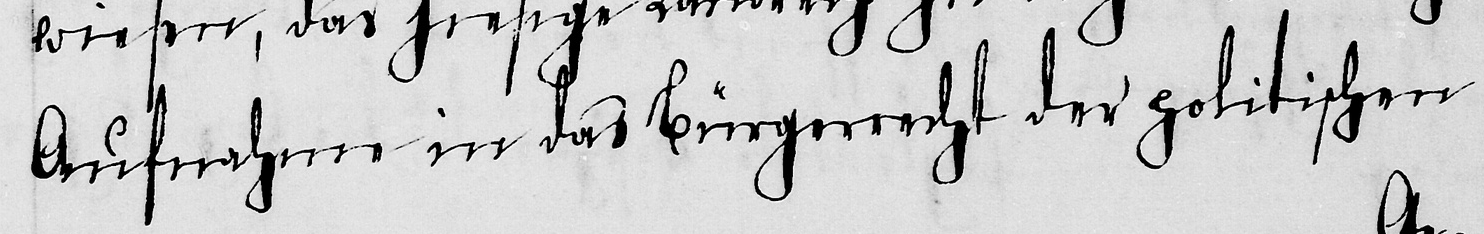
Aufnahme in das Bürgerrecht der politischen
